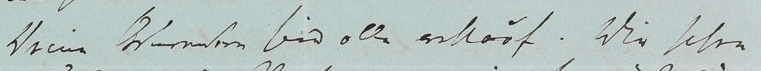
Deine Bekannten sind alle wohlauf. Wir sehen
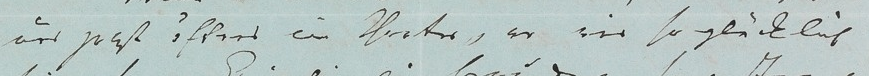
uns jetzt öfters im Theater, wo wir so glücklich
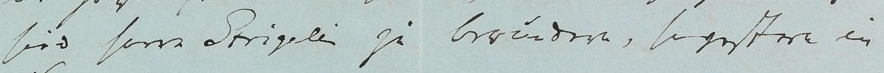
sind Herrn Strigelli zu bewundern, so gestern in
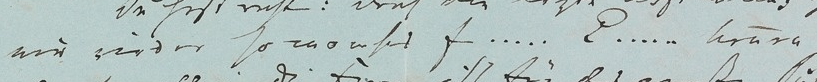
wir wieder so manches f..... L...... kennen
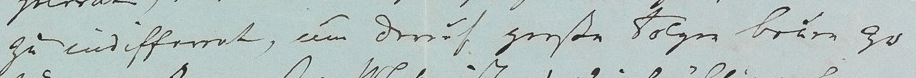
zu indifferent, um darauf große Folgen bauen zu
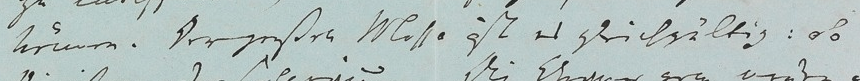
können. Der großen Masse ist es gleichgültig: ob
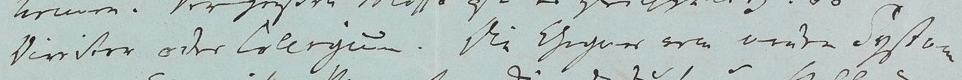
Director oder Collegium. Die Gegner vom neuen System
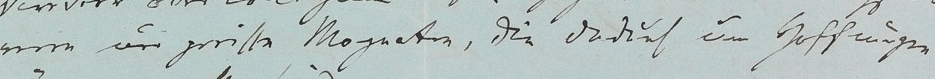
waren nur gewisse Magnaten, die dadurch um Hoffnungen
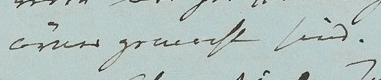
ärmer gemacht sind.
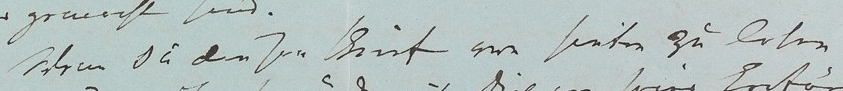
Wenn Du diesen Brief von hinten zu lesen
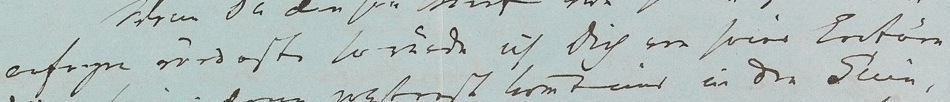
anfangen würdest so würde ich Dich von seiner Lectüre
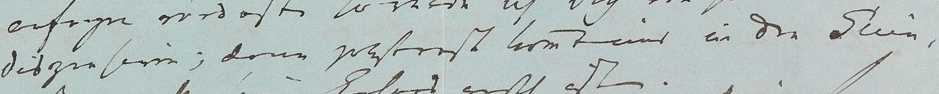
dispensiren; denn jetzt erst kommt mir in den Sinn,
